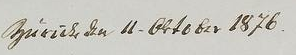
Zürich den 11. Oktober 1876.
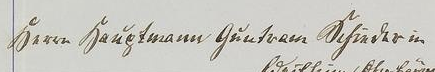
Herrn Hauptmann Guntram Schieder in
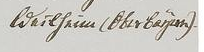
Weilheim (Oberbayern)
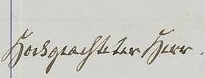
Hochgeachteter Herr!
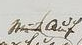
Beantwortung
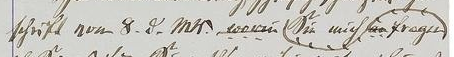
schrift vom 8. d. Mts. worinanfragen Sie mich
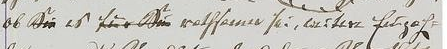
ob Sie es für Sie rathsamer sei, weitere Einzah-
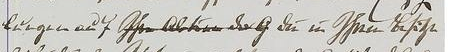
lungen auf Ihre Aktien der G die in Ihrem Besitze
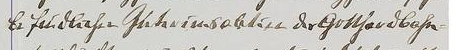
befindlichen Interimsaktien der Gotthardbahn-
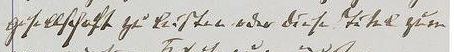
gesellschaft zu leisten oder diese Titel zum
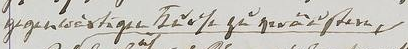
gegenwärtigen Kurse zu veräußern,
